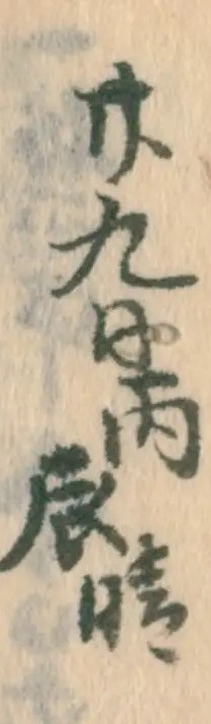廿九日丙辰晴
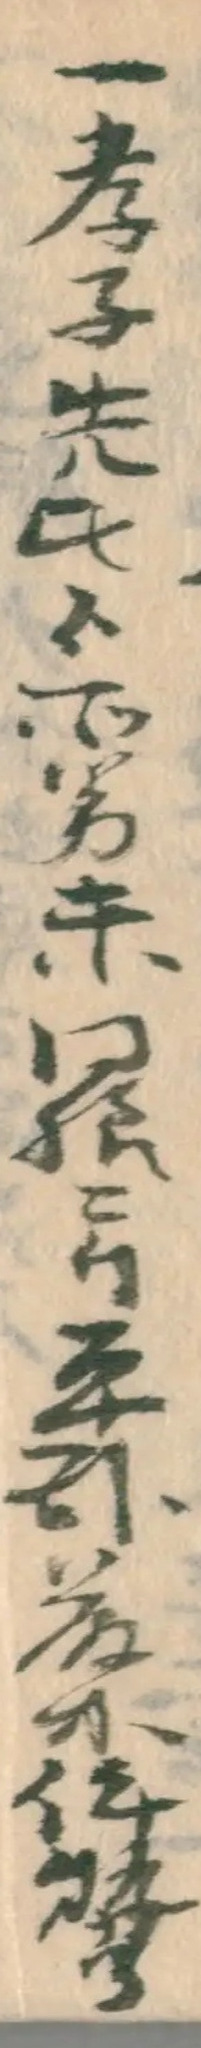一孝子先頃ゟ所労未同様ニ付平臥藤木伊勢守
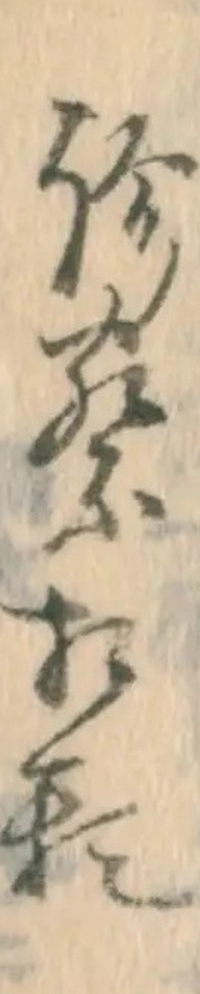診察相頼
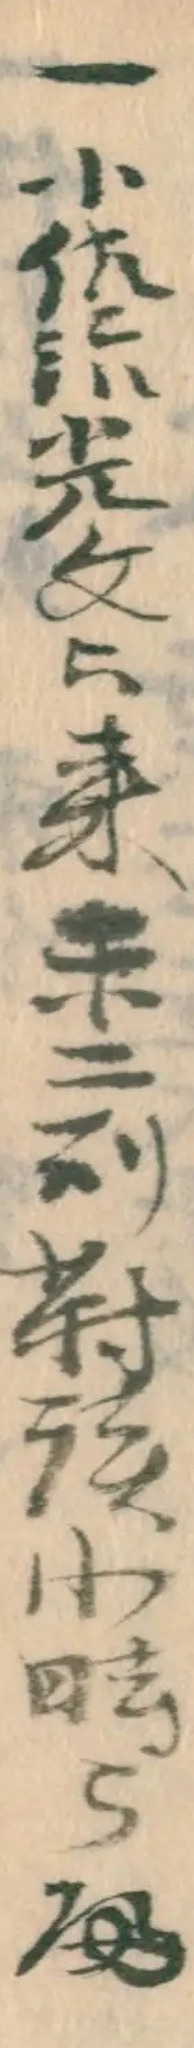一小佐治光文被参未二刻対談小時被帰
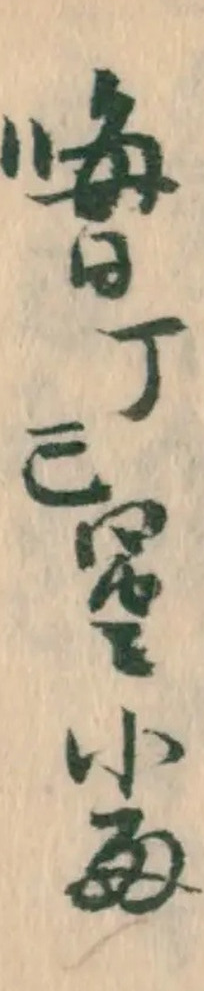晦日丁巳曇小雨
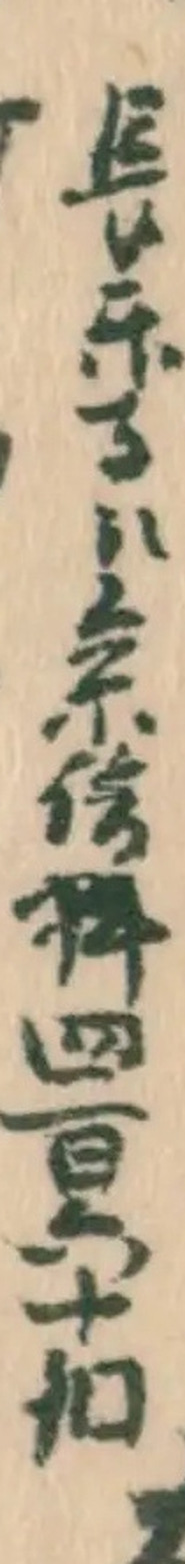長楽寺え参詣棹四百六十銅
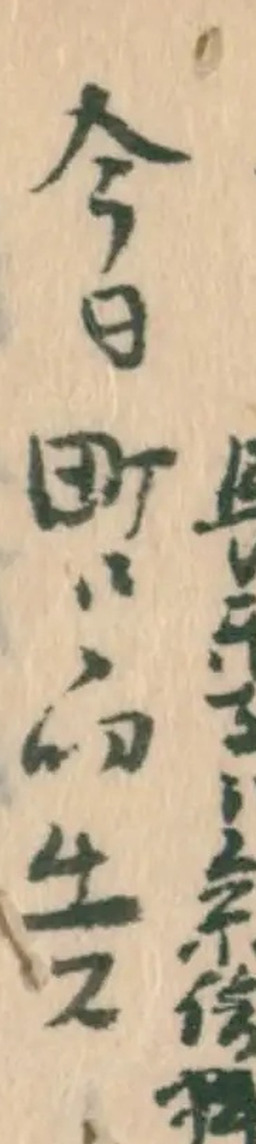今日町口え出ス
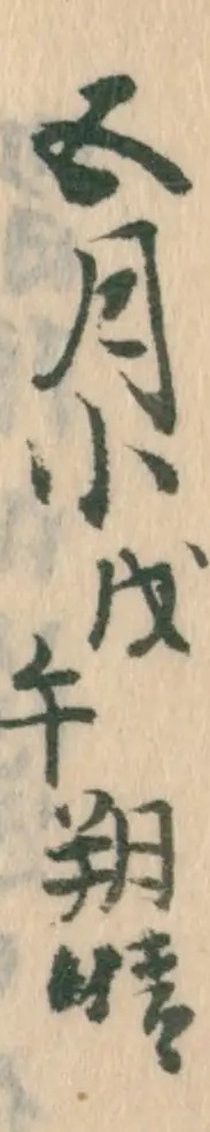五月小戊午朔晴
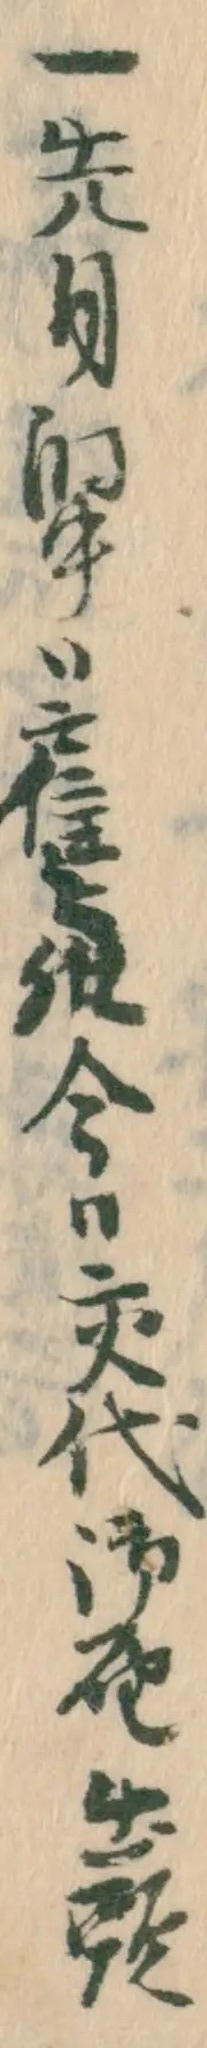一先月洞中御雇衆今日交代御届出頭
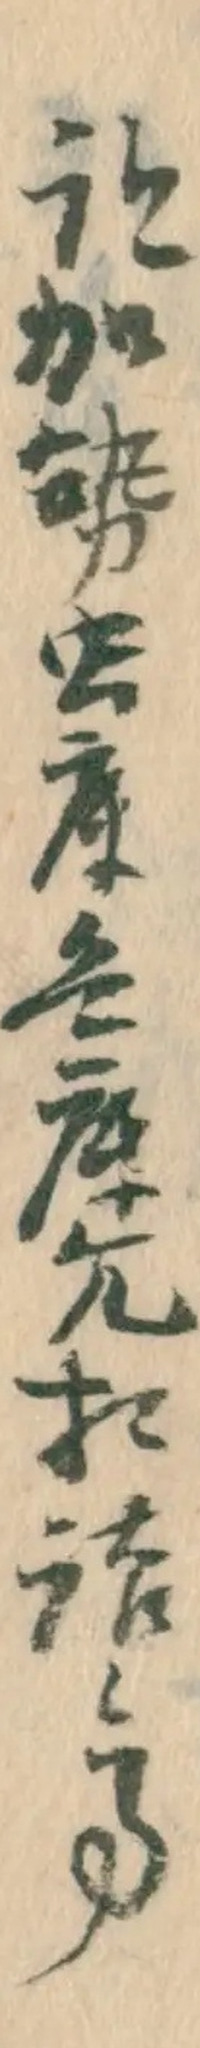跡加勢虫鹿兵庫允相詰候事
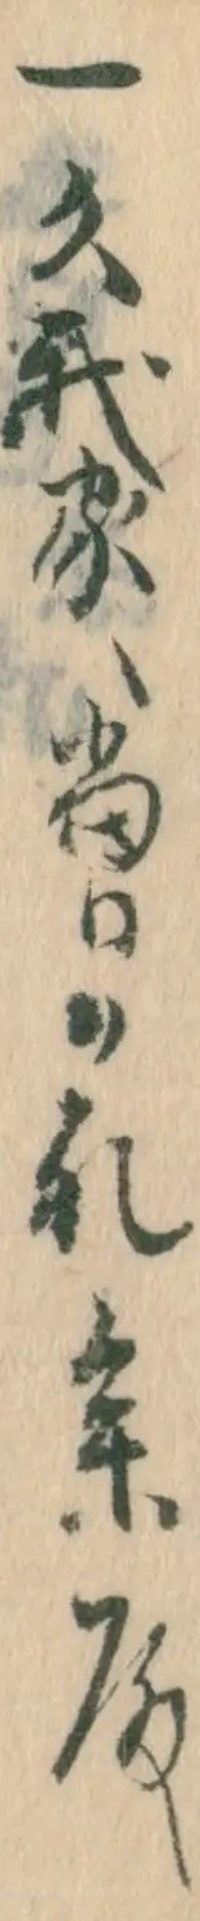一久我家へ当日御礼参殿

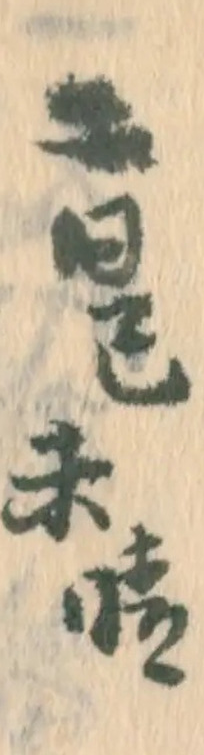二日己未晴
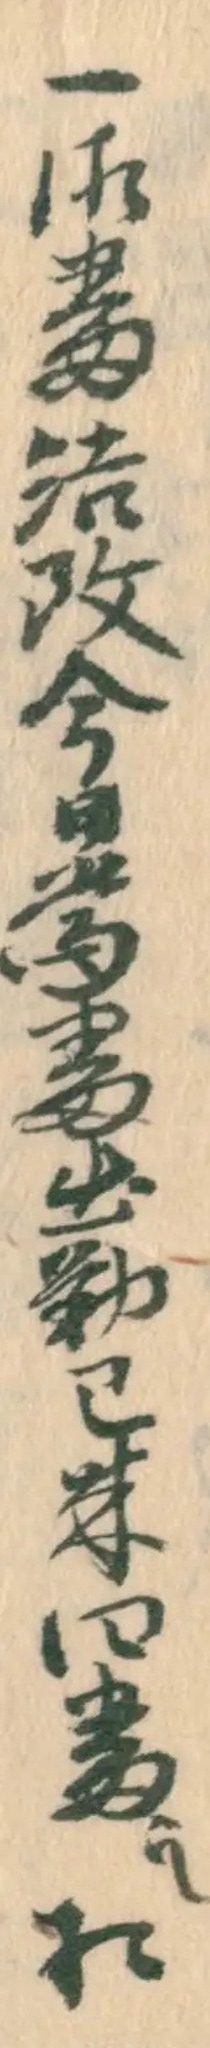一御番詰改今日当番出勤已来四番ツヽ相
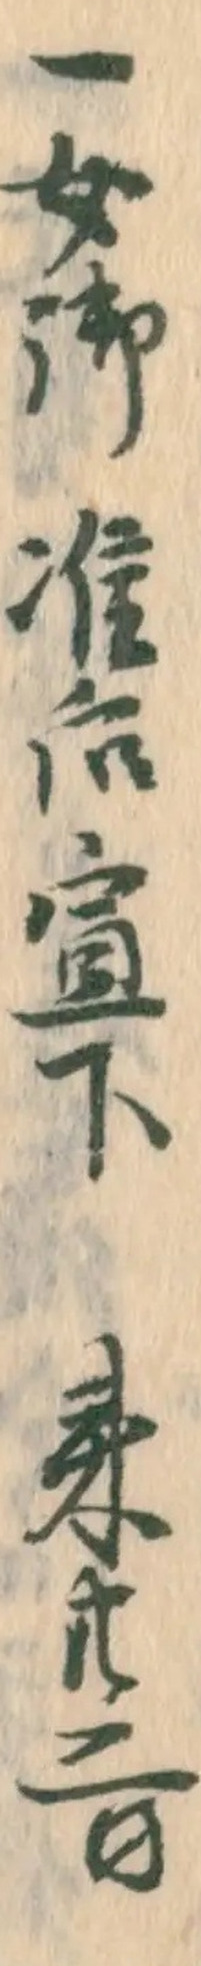一女御准后宣下来廿二日
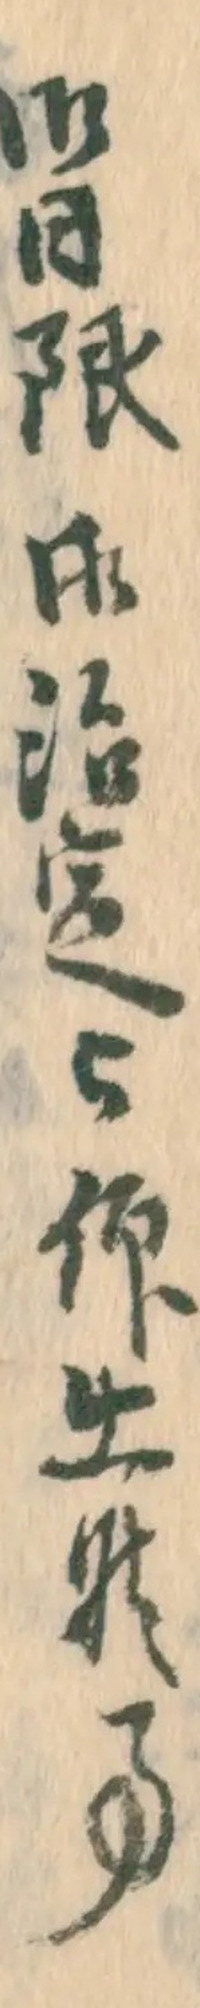御日限御治定被仰出候事
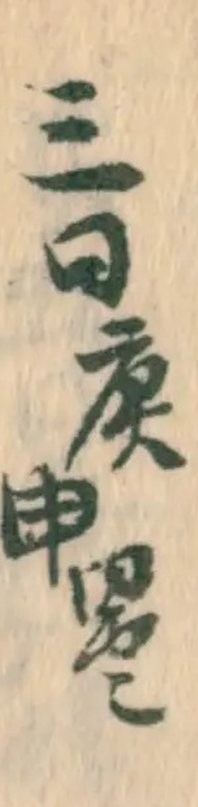三日庚申曇
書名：禁裏御所御用日記. [131]
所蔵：国立国会図書館 National Diet Library, JAPAN
